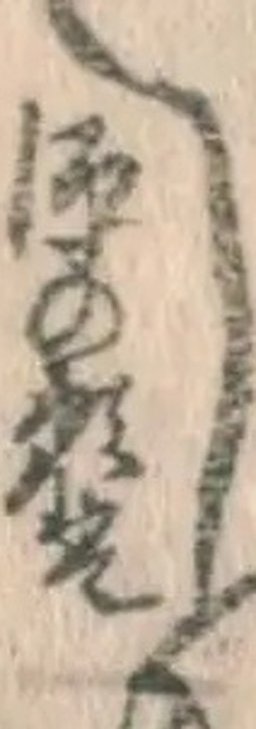源の頼光
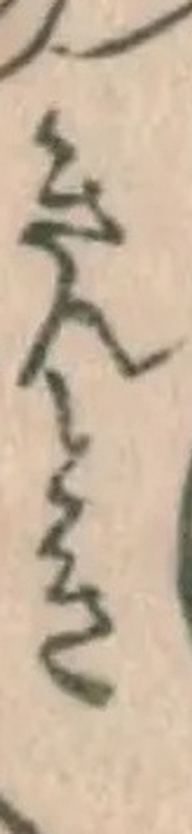きんとき
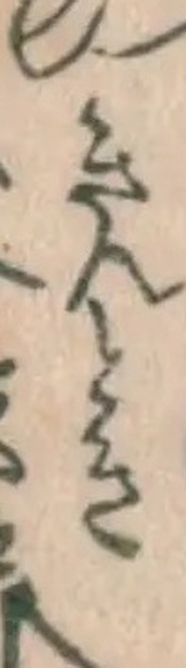きんとき
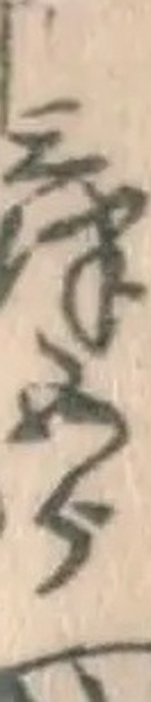三津五郎
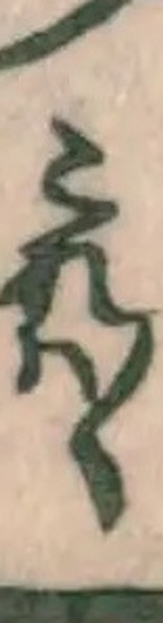これは〳〵
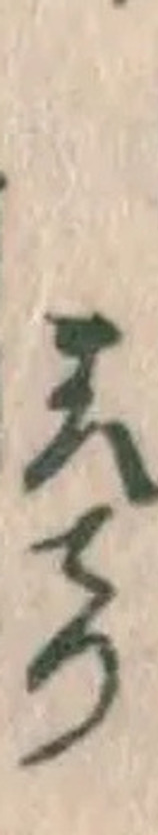まんてつ
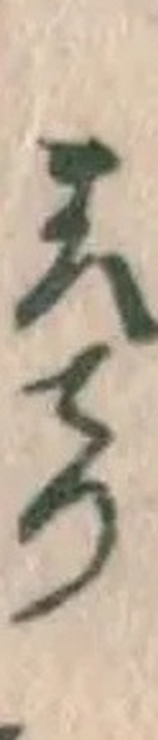まんてつ
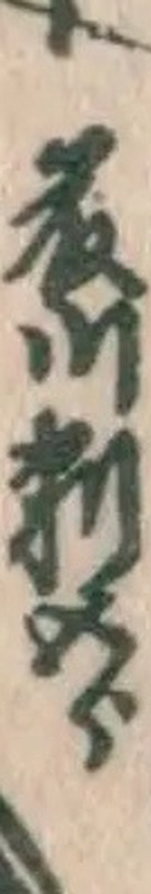藤川判五郎
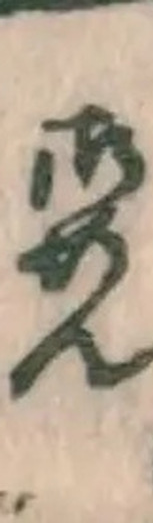御めん
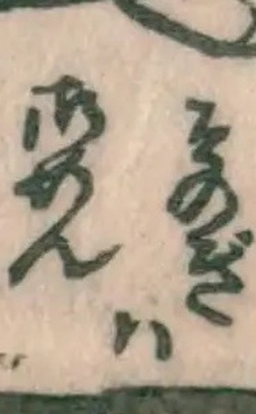御めん
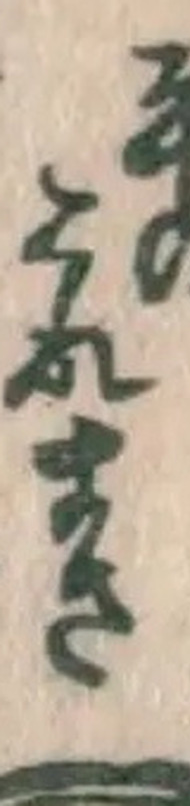これまさ
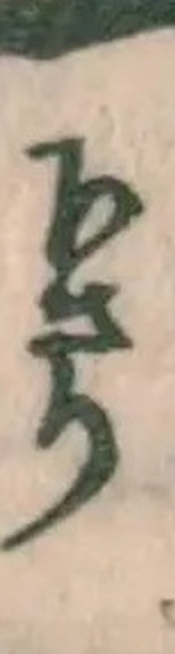下さり
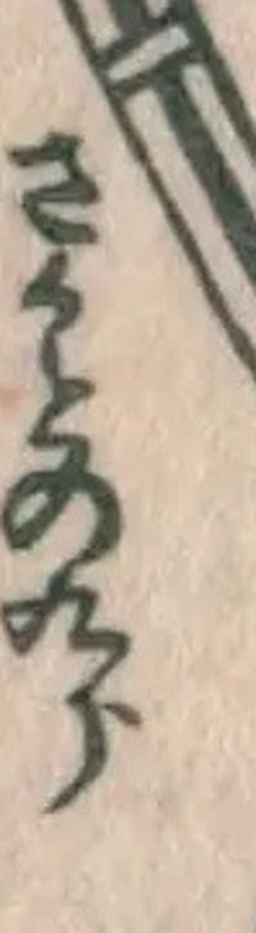さかとの九郎
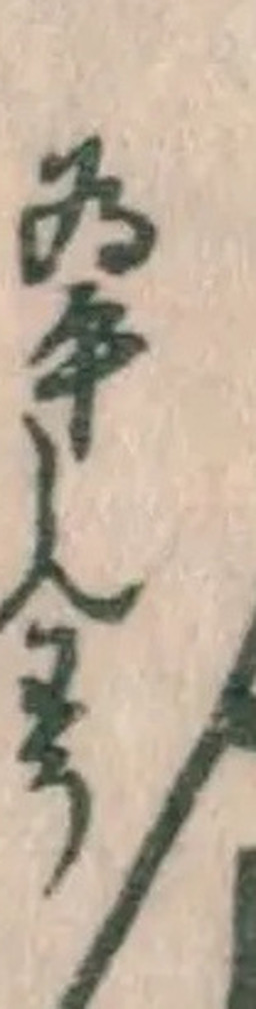為平しんわう
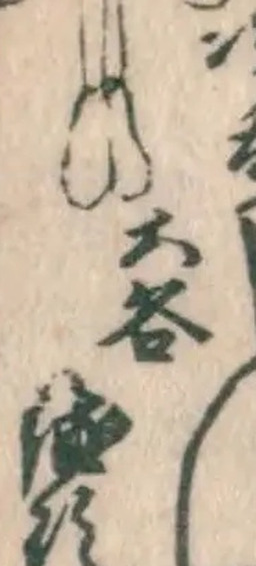大谷徳次

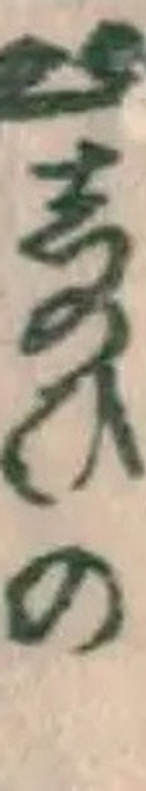しのひの
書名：菊慈童酒宴岩窟
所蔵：国立国会図書館 National Diet Library, JAPAN
